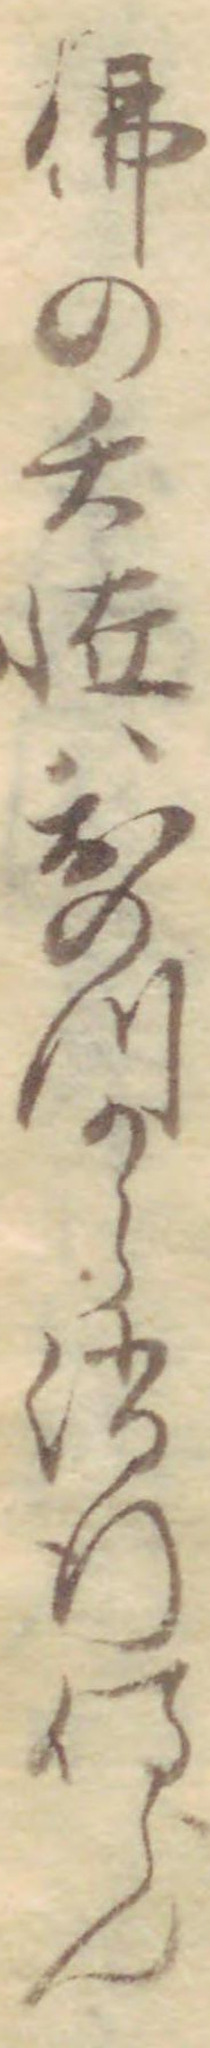仏の夭怪はおのつから消行侍らん

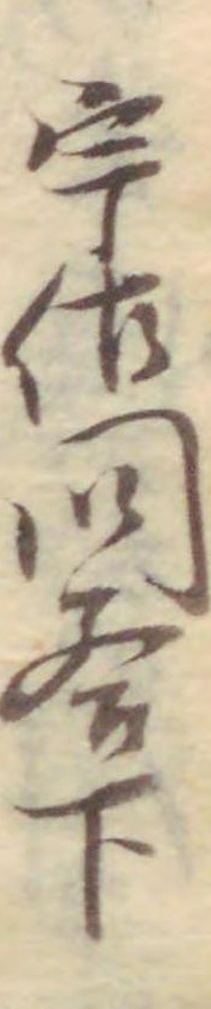宇佐問答下
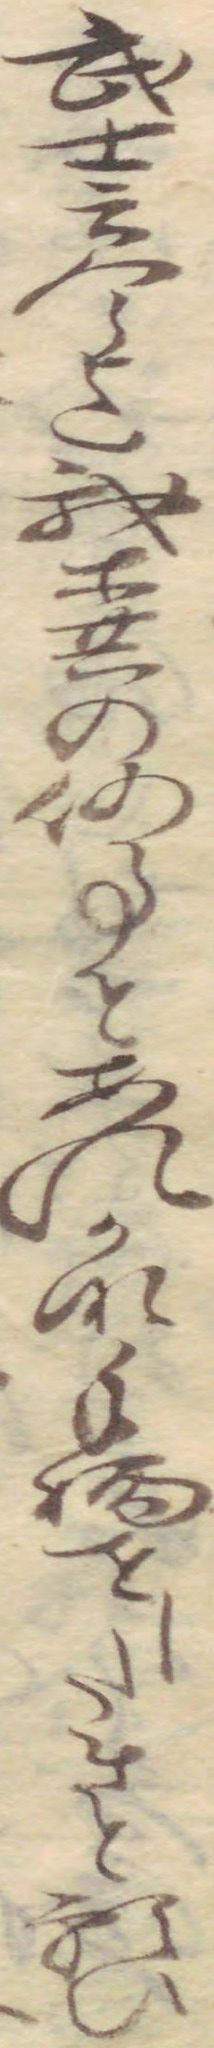武士云今迄我等共の何事そあれかな手柄をしたきと願ひ
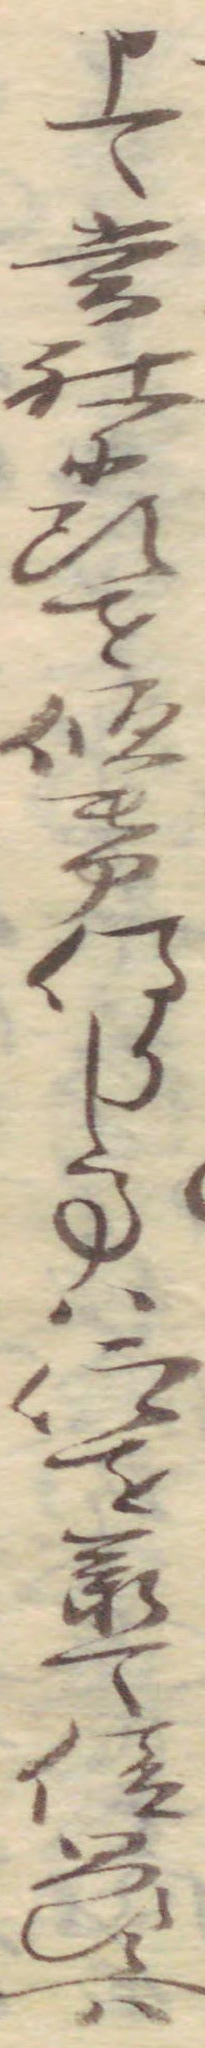申て当社に頭を傾け侍りし事は仰を承て倩思ひ候へは
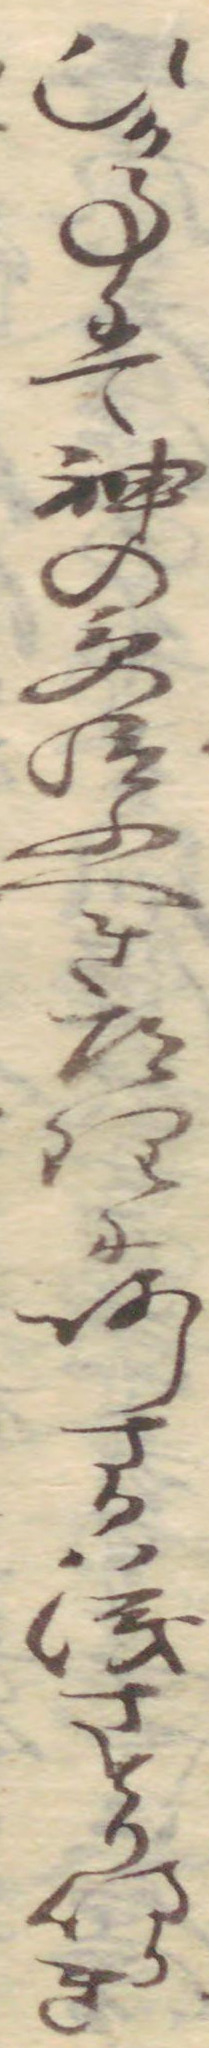ひか事にて神の受給ふへき道理にあらさるは儀さとり侍りき
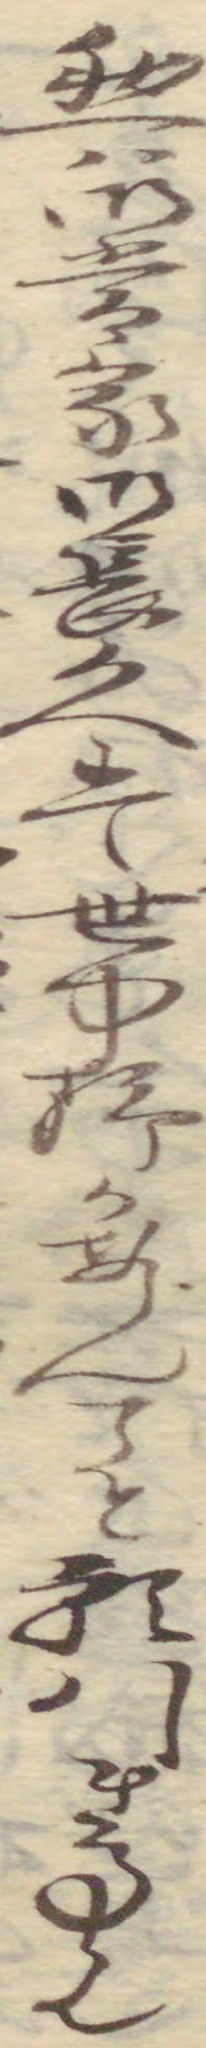然は御当家御長久にて世中静ならんこそ願はしき事ニて
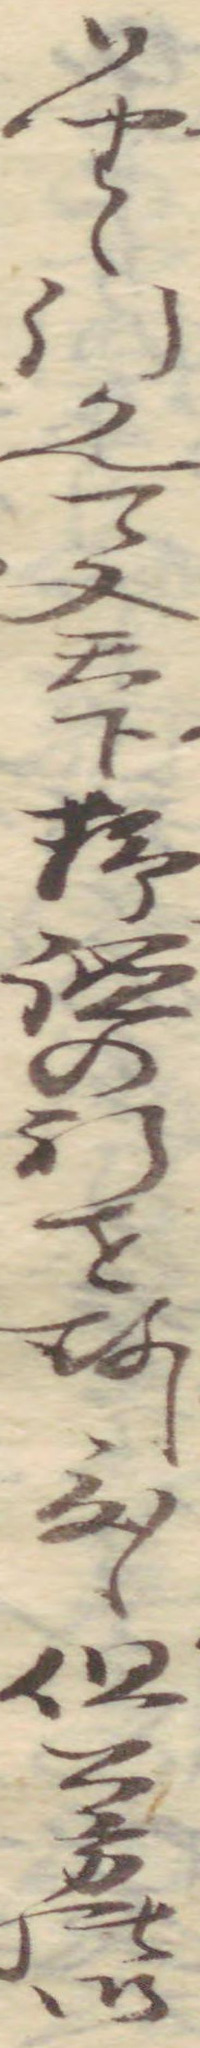御座候引かへて又天下静謐の祈を致し度候但公方の御
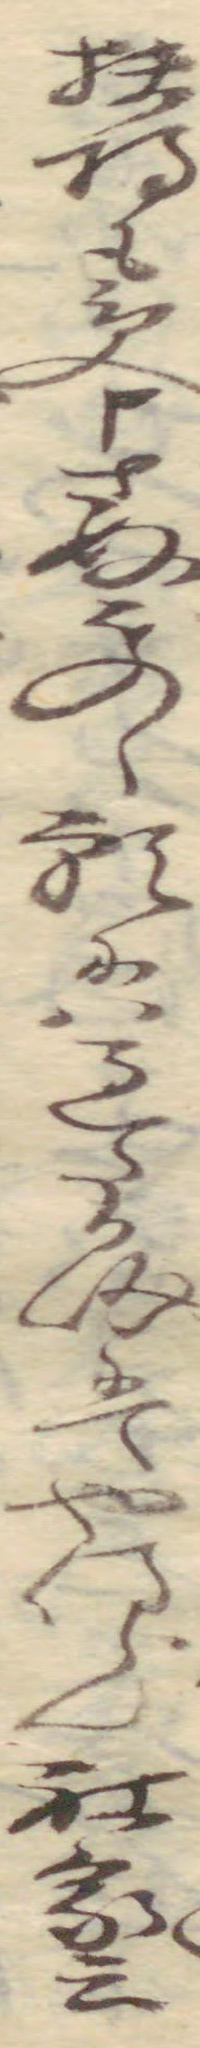扶持も受申さぬものゝ願には過たる儀にてや侍らん社家云
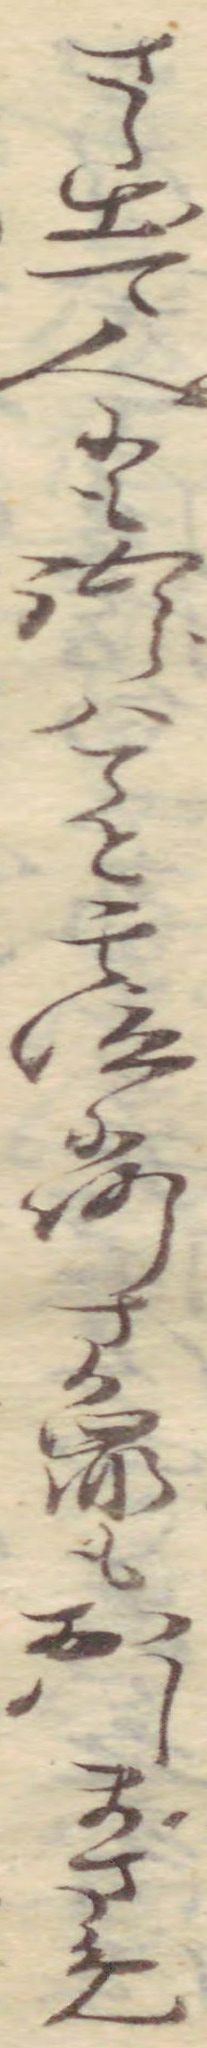さし出て人にも語らはこそ其位にあらさる罪もおはしまさめ
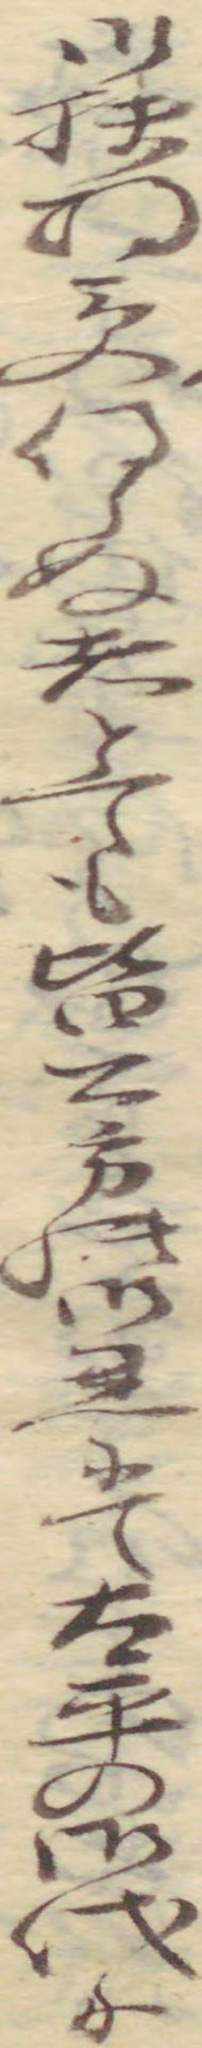御扶持受侍らぬ者とても皆公方の御恩にて太平の御代に
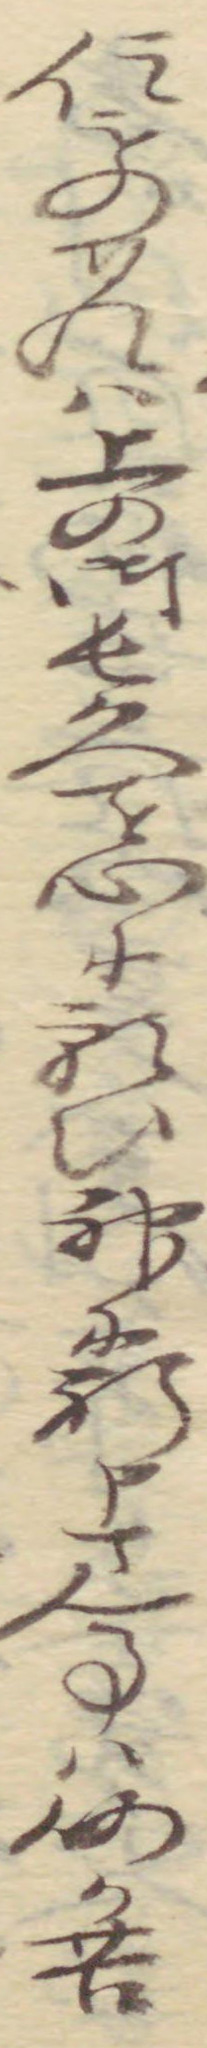住ものなれは上の御長久を心に願ひ神に祈申さん事は何か苦
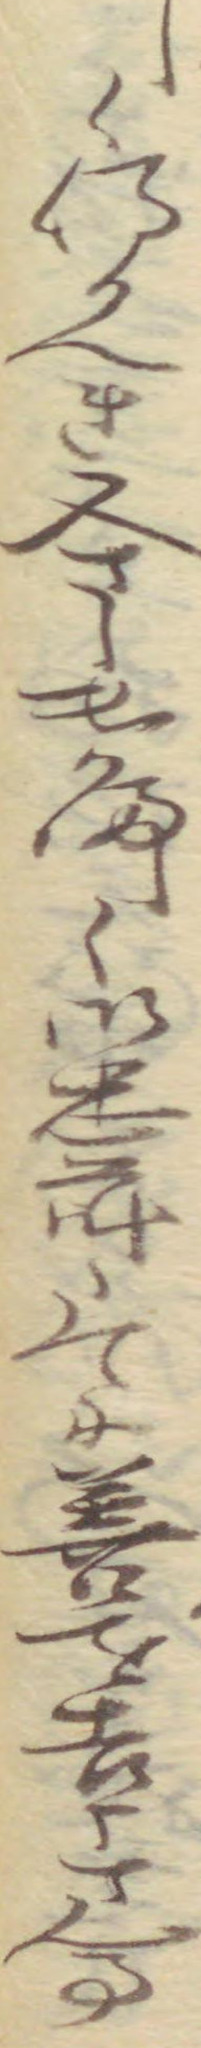しく侍るへき又さし出かましく御忠節たてに善を告申さん事
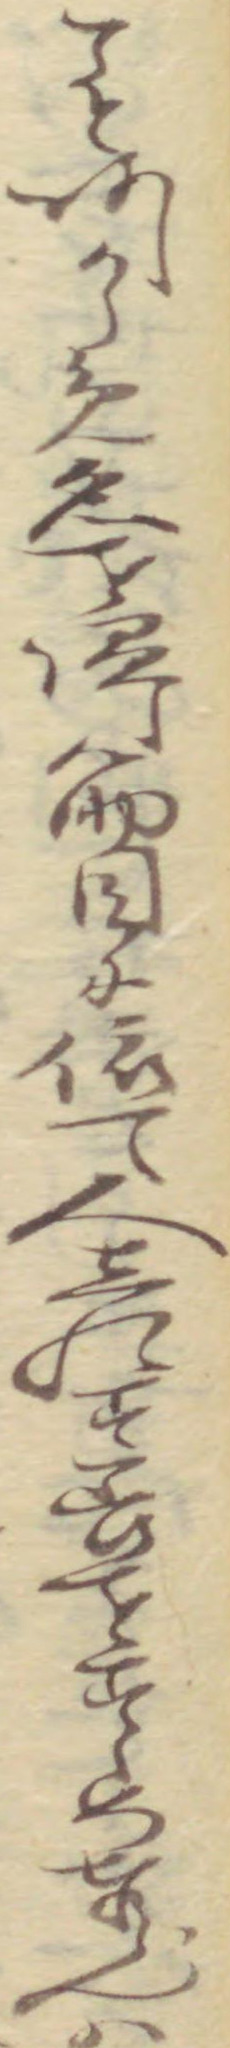ことあしからめ名を隠し筋目に依て人しれす善をすゝめ奉らんは
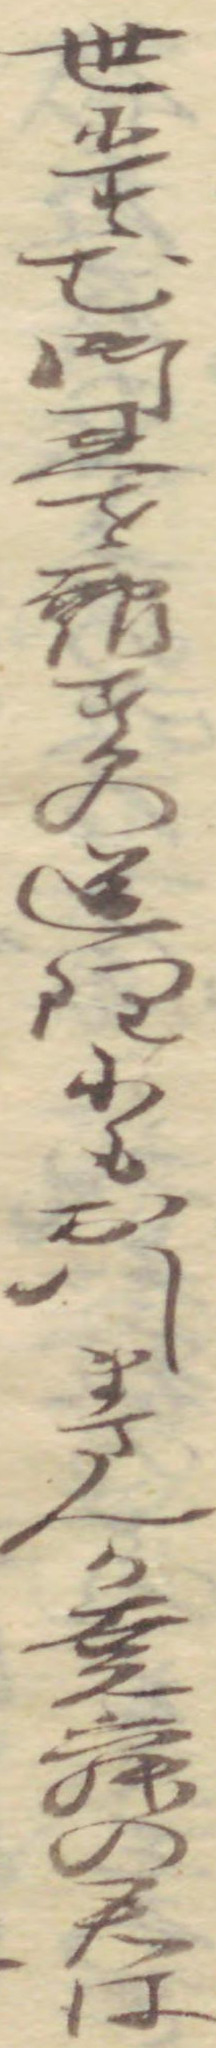世にすむ御恩を報するの道理にもおはしまさんか堯舜の君は
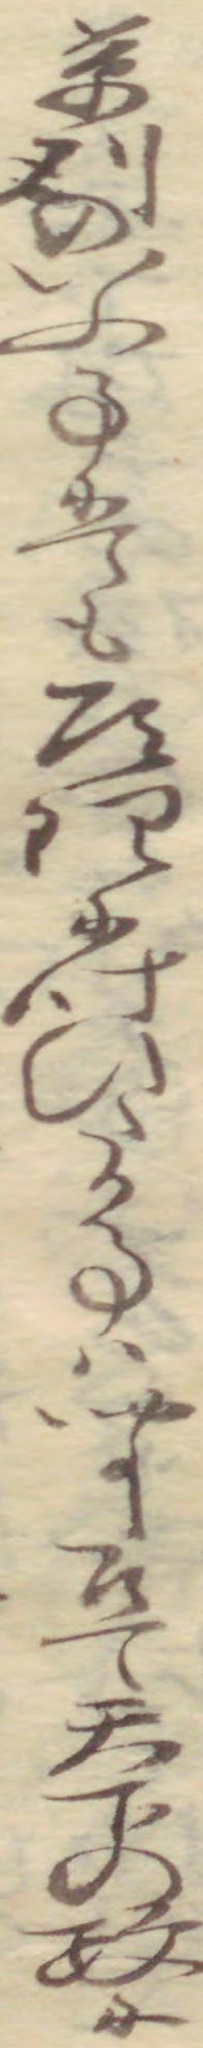草刈のいふ事にても道理に叶ひたる事は聞し召て天下の政に
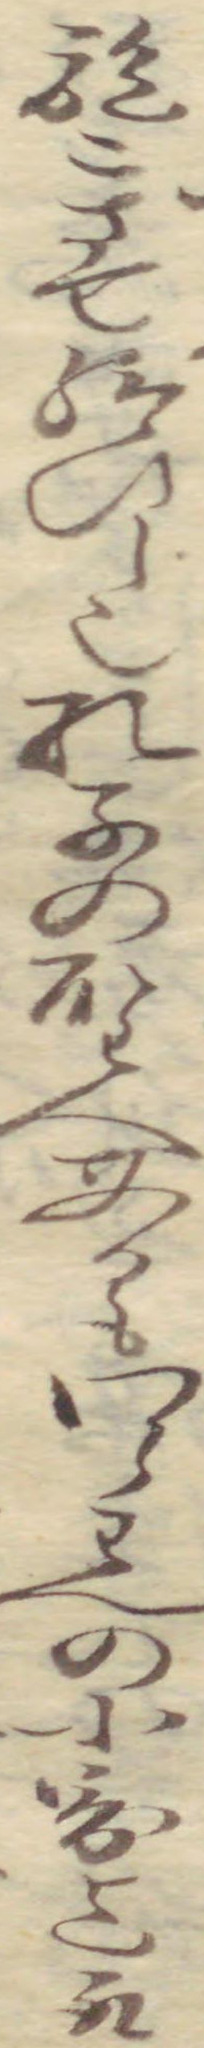施こさせ給ひし也孔子の聖人なるもわらわへの小歌迄取
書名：鶯宿雑記. 巻263-264
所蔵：国立国会図書館 National Diet Library, JAPAN
